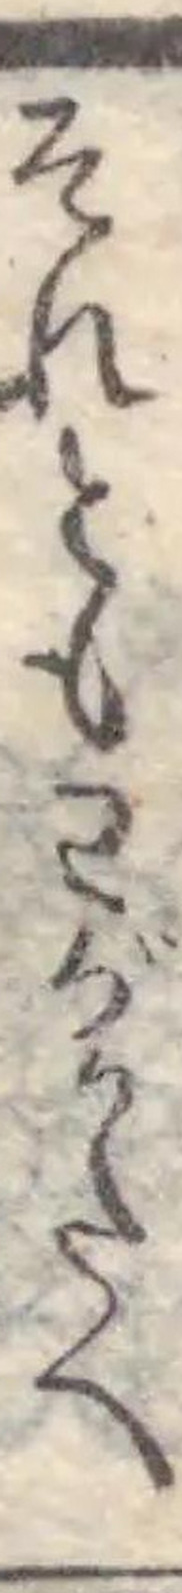それともわがかたへ
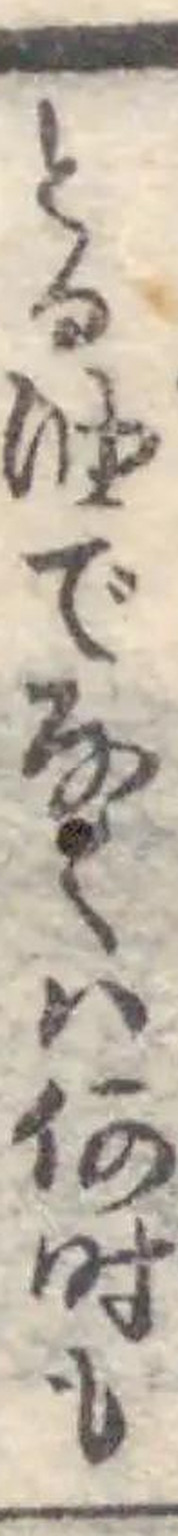とる油でなくは何時も
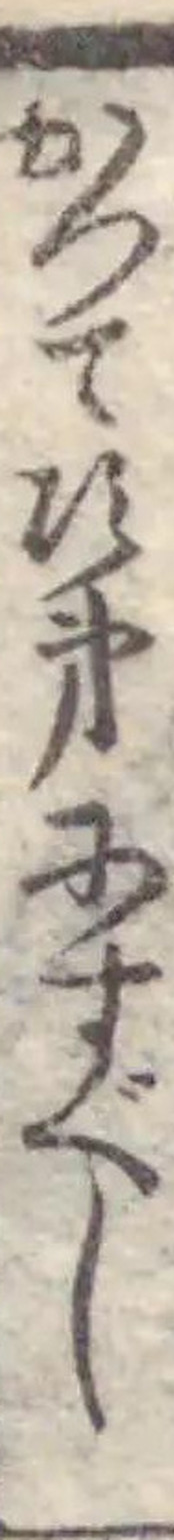かつて次第にすべし

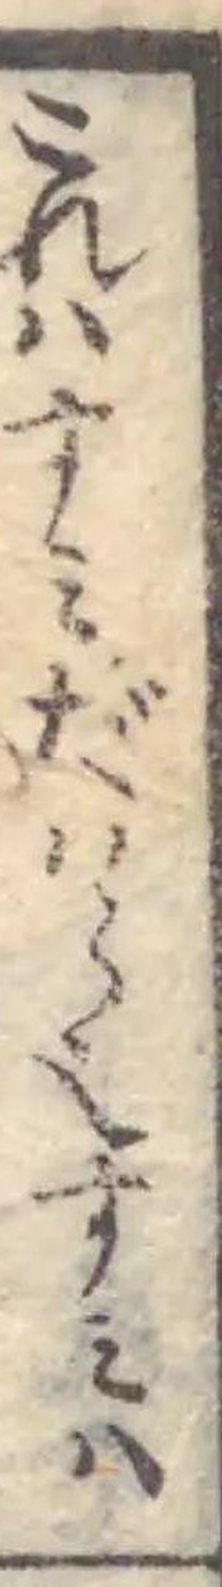これはすみだはら也すみは
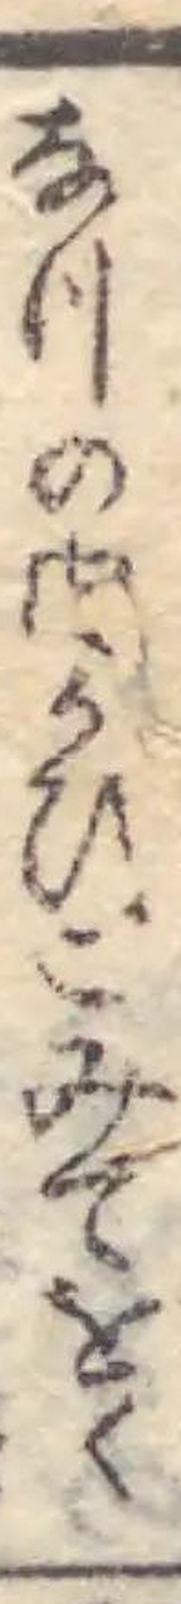なつの内かひごみてをく
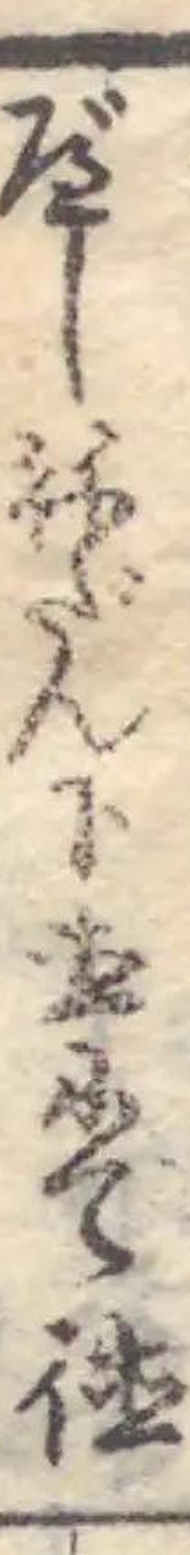べしねだん下値にて徳
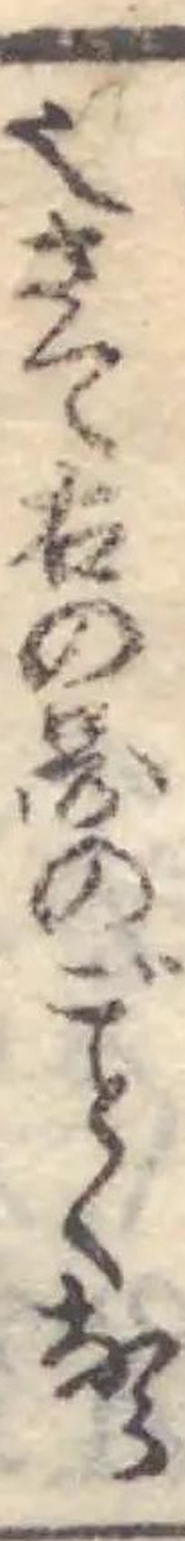也さて右の図のごとくなら
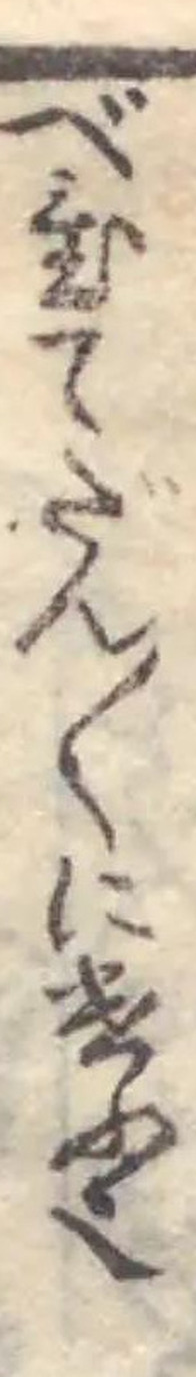べ置てだん〳〵に遣ふ也
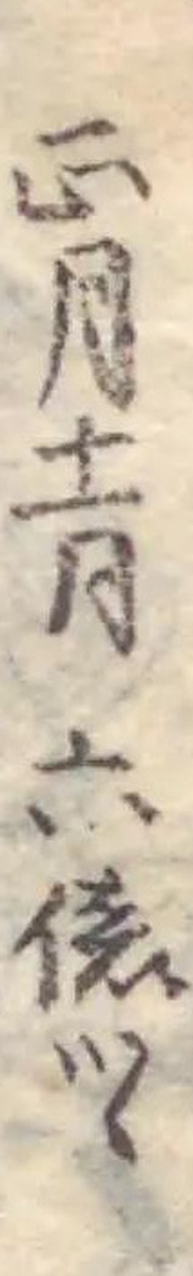正月十一月六俵つゝ
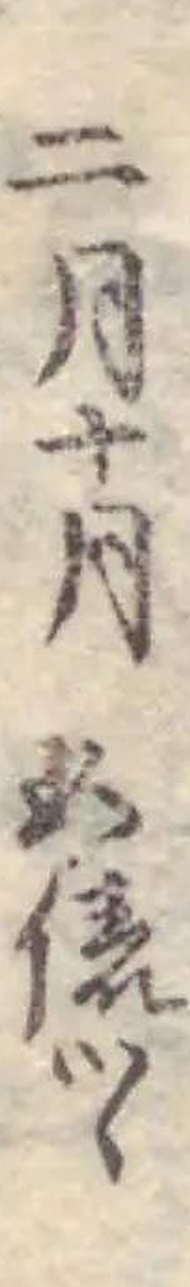二月十月五俵つゝ
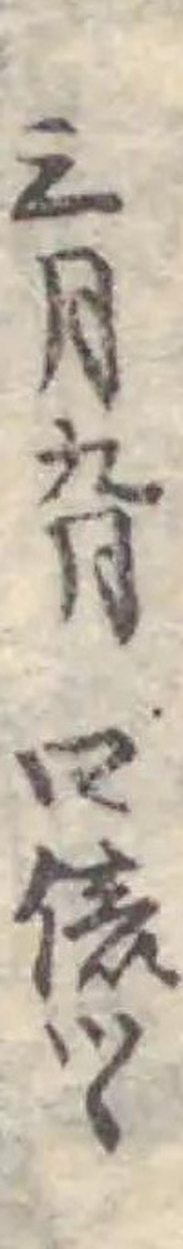三月九月四俵つゝ
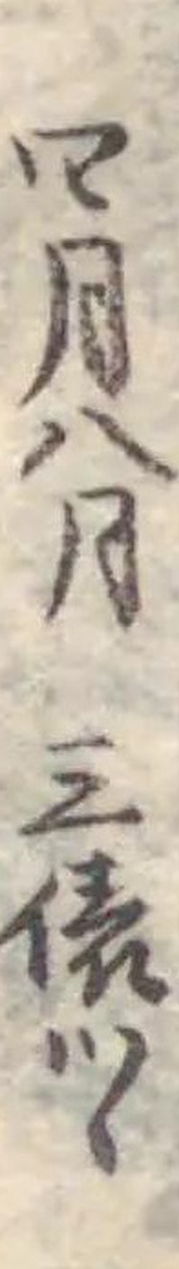四月八月三俵つゝ
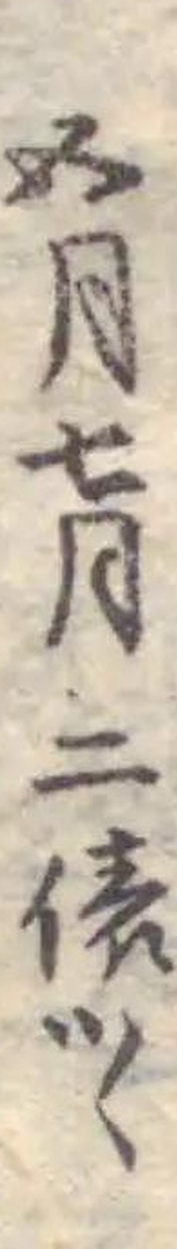五月七月二俵つゝ
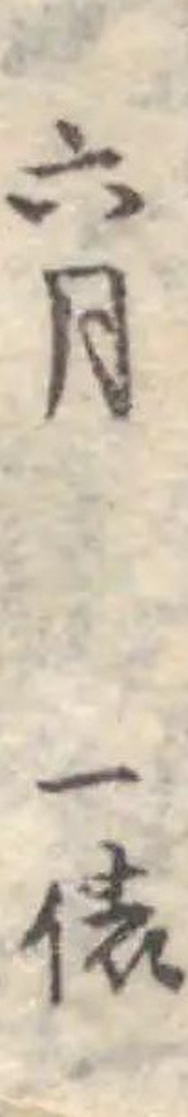六月一俵
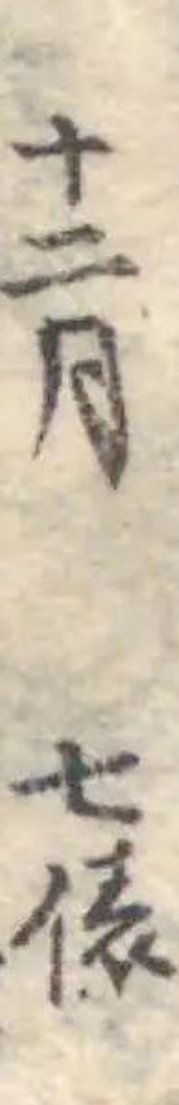十二月七俵
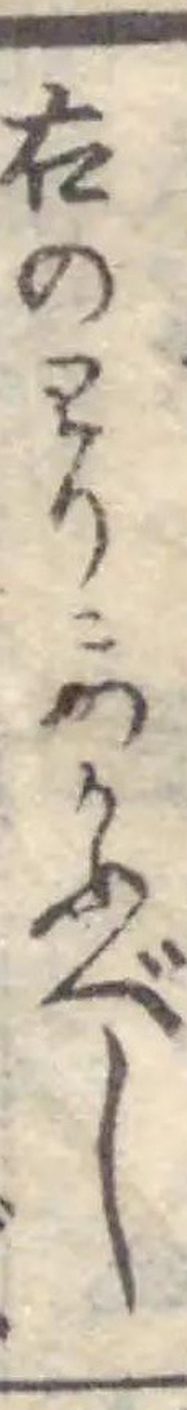右のわりにつかふべし
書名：大通人好記
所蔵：国立国会図書館 National Diet Library, JAPAN
